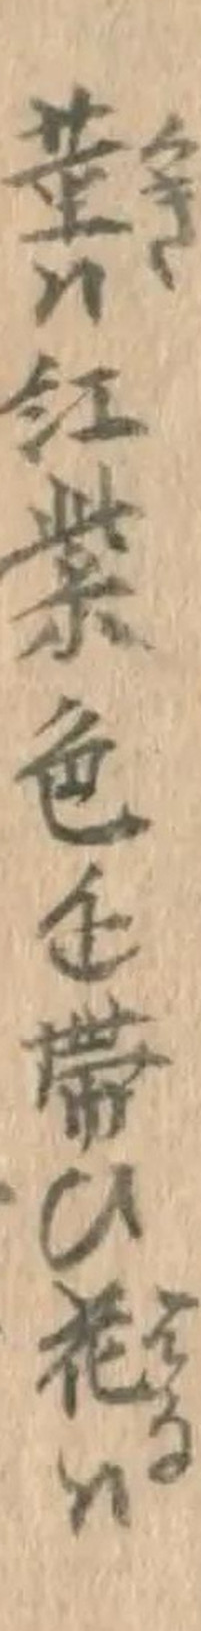茎は紅紫色を帯ひ花は
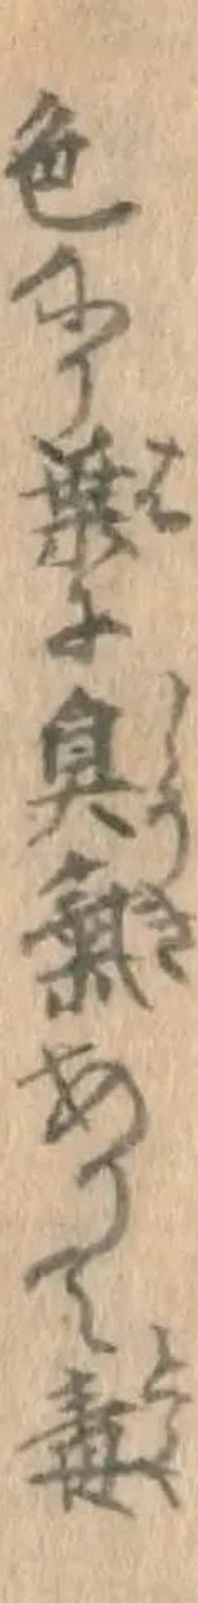色なり葉に臭気ありて毒
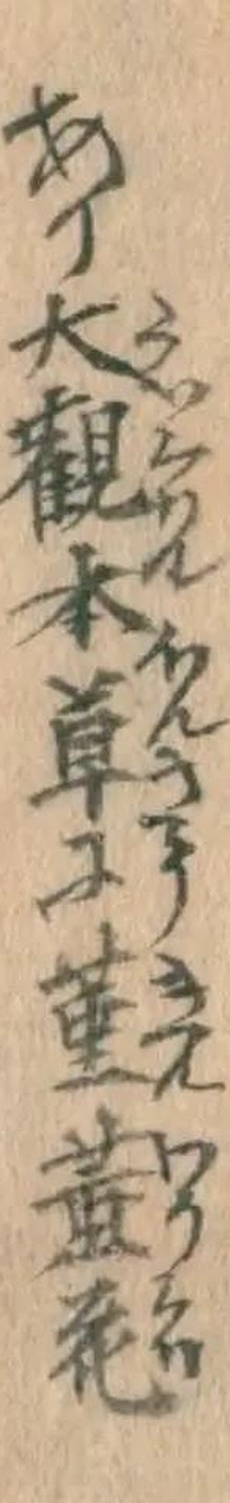あり大観本草に菫黄花
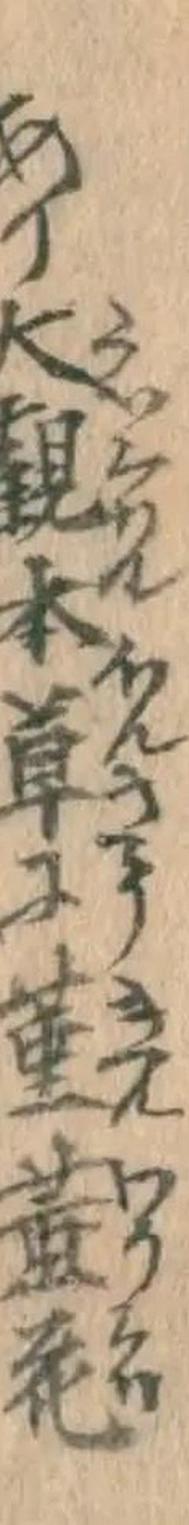あり大観本草に菫黄花
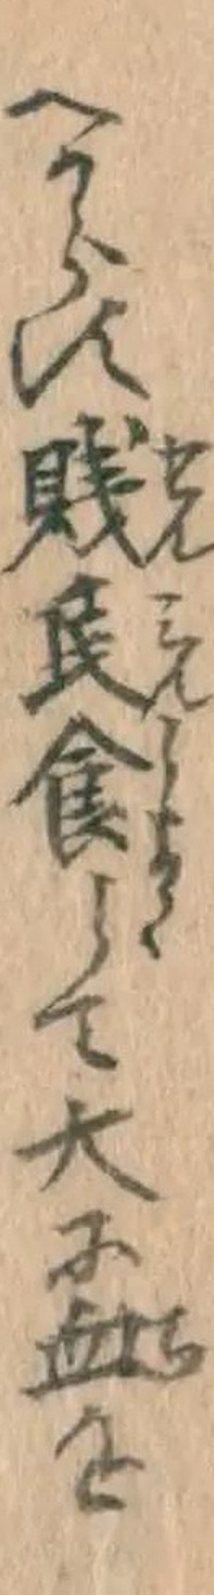へからす賤民食して大に血を
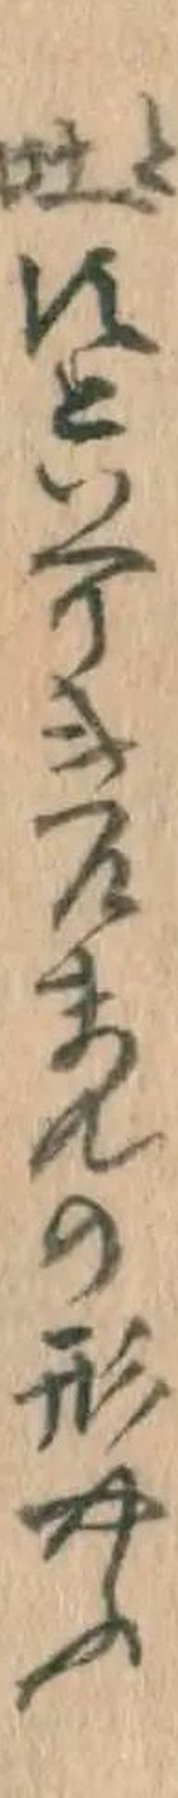吐すといへりきんまんの形やふ
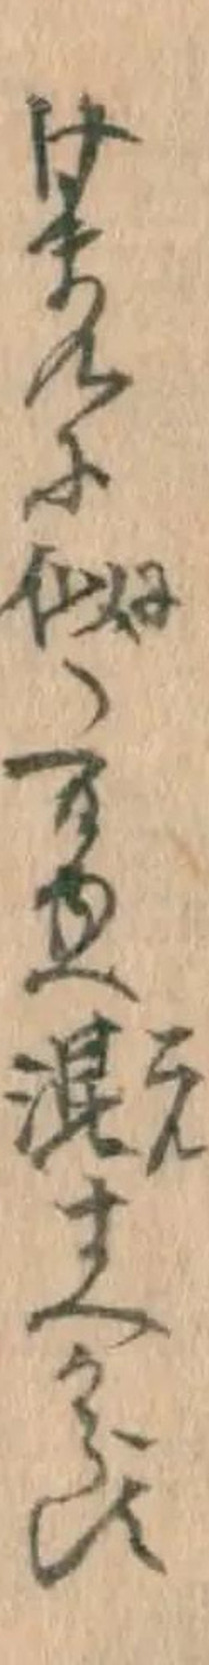けまんに似たるゆへ混すへからす
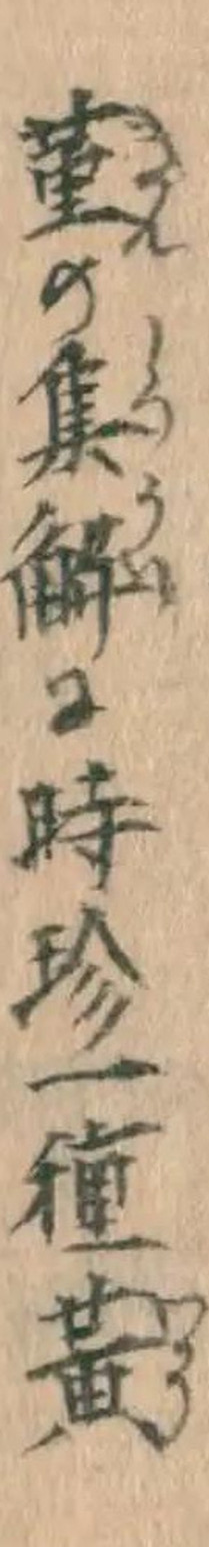菫の集解に時珍一種黄
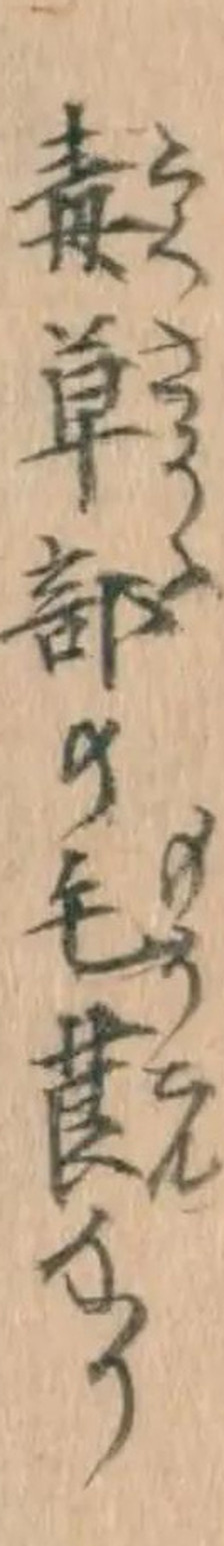毒草部の毛茛なり
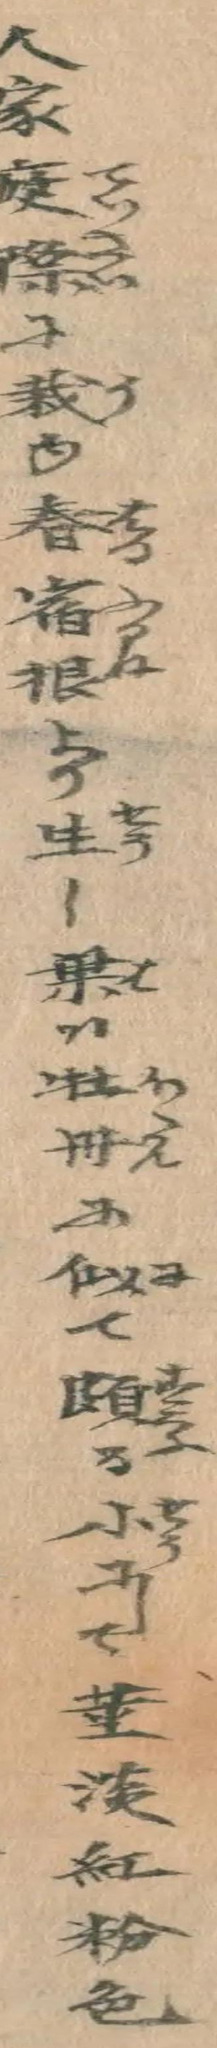人家庭際に栽ゆ春宿根より生し葉は牡丹に似て頗る小にして茎淡紅粉色
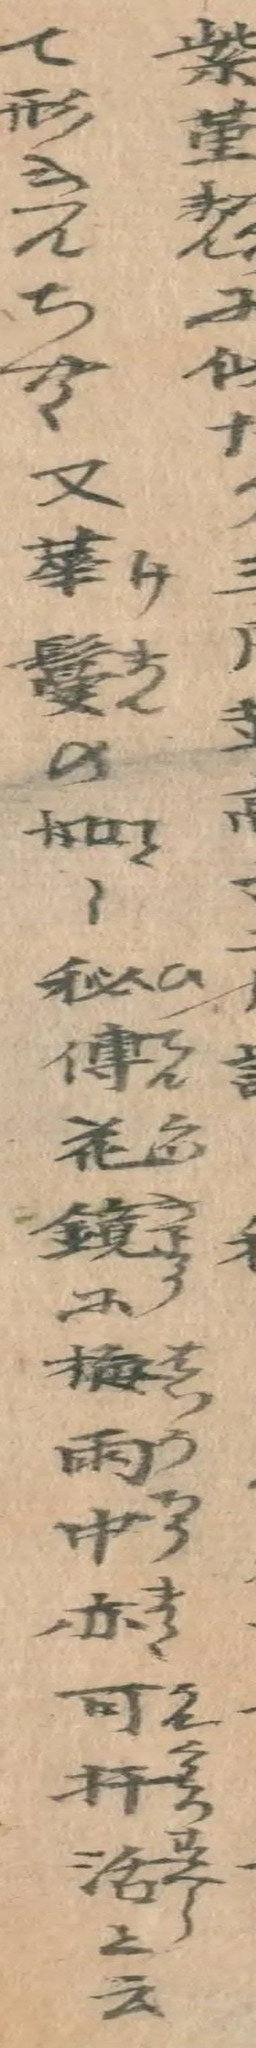て形きんちやく又華鬘の如し秘伝花鏡に梅雨中亦可扞活と云
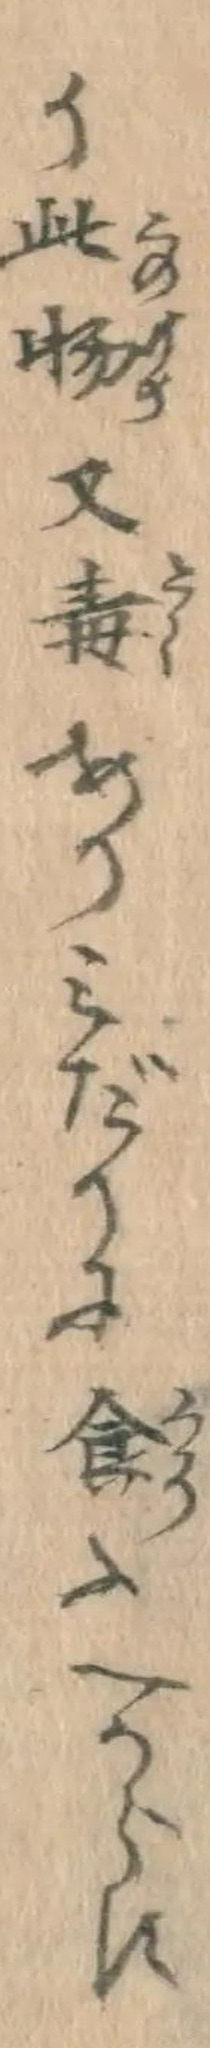り此物又毒ありみだりに食ふへからす

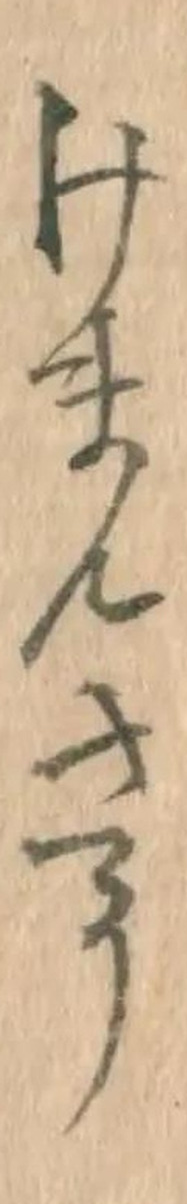けまんさう

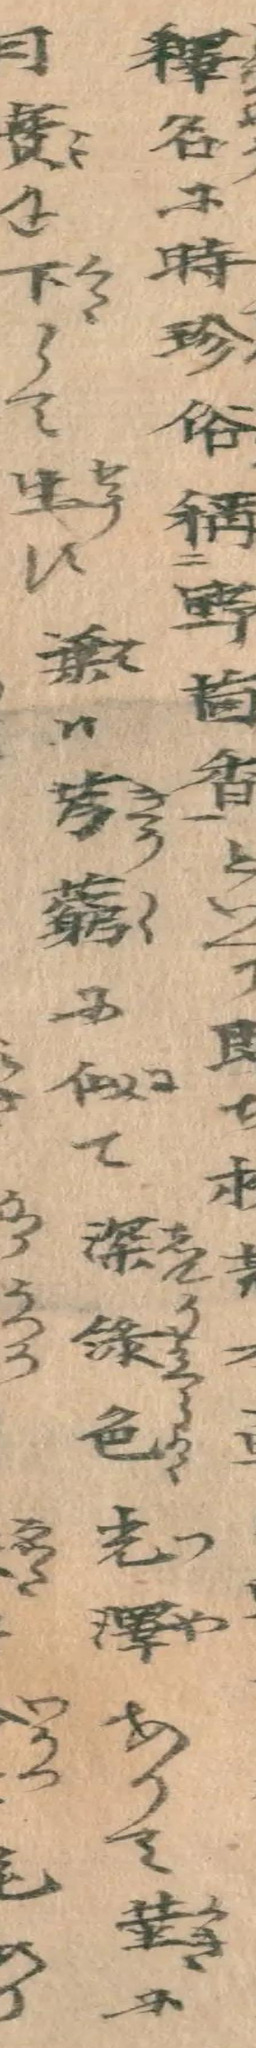月実を下して生す葉は芎藭に似て深緑色光沢ありて茎に
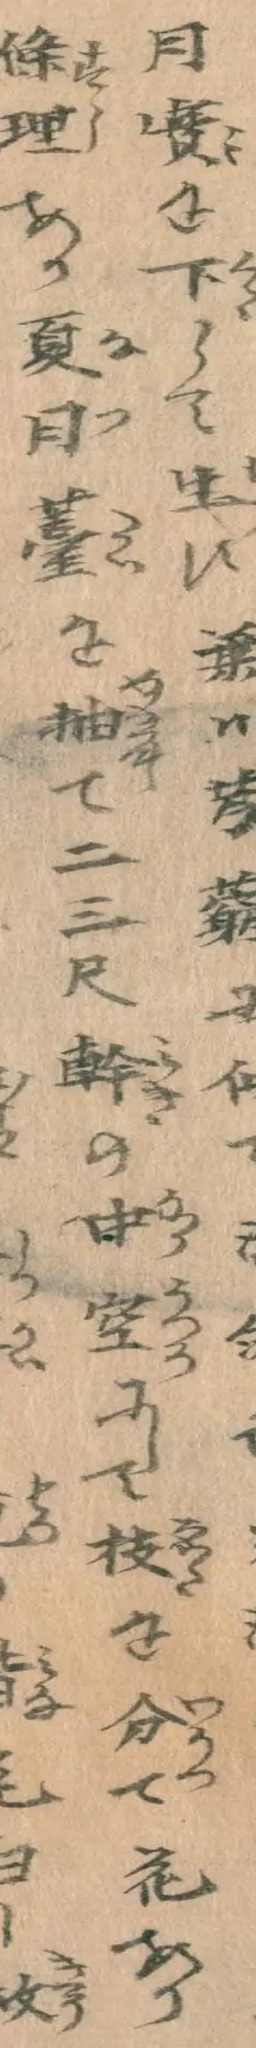条理あり夏月薹を抽て二三尺幹の中空にして枝を分て花あり
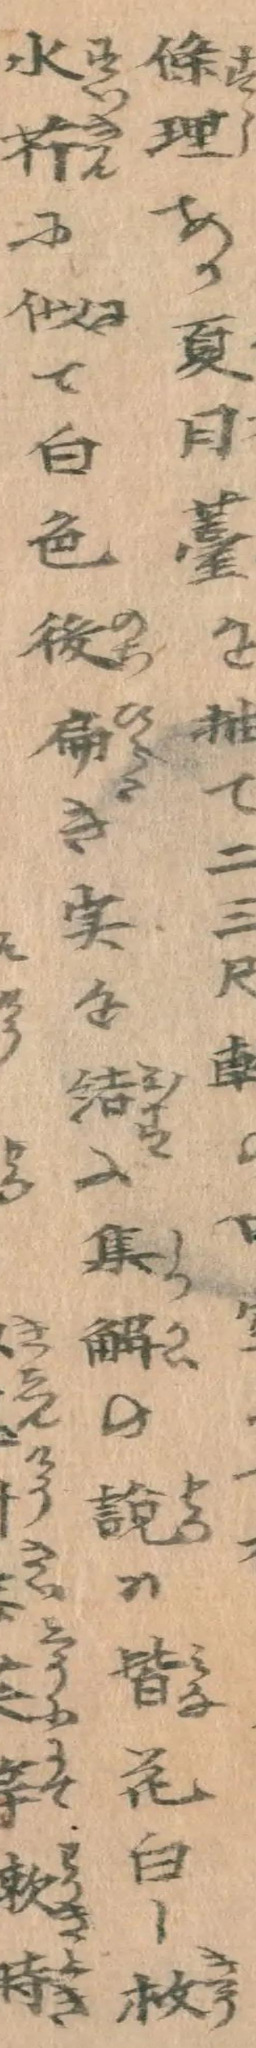水芹に似て白色後扁き実を結ふ集解の説は皆花白し救
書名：本草図譜. 巻46-48
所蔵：国立国会図書館 National Diet Library, JAPAN
